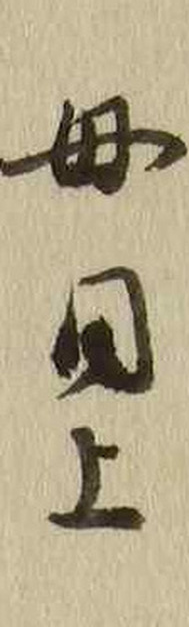母同上
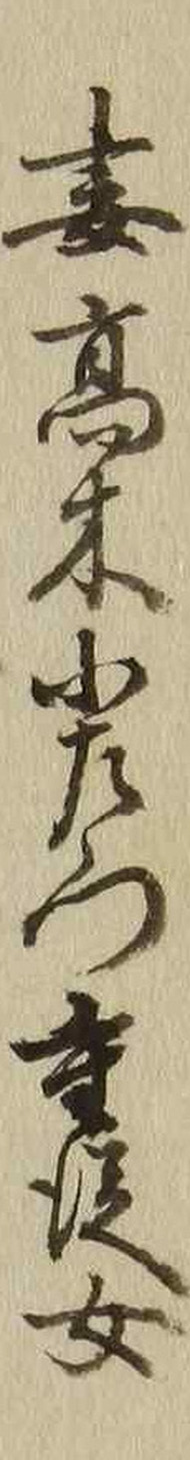妻髙木小左衛門重従女
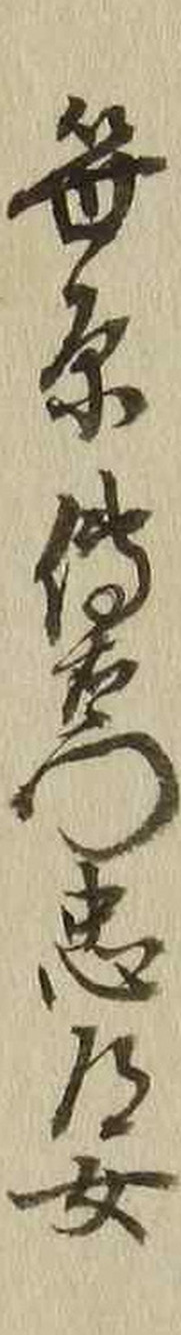笹原伝右衛門忠道女
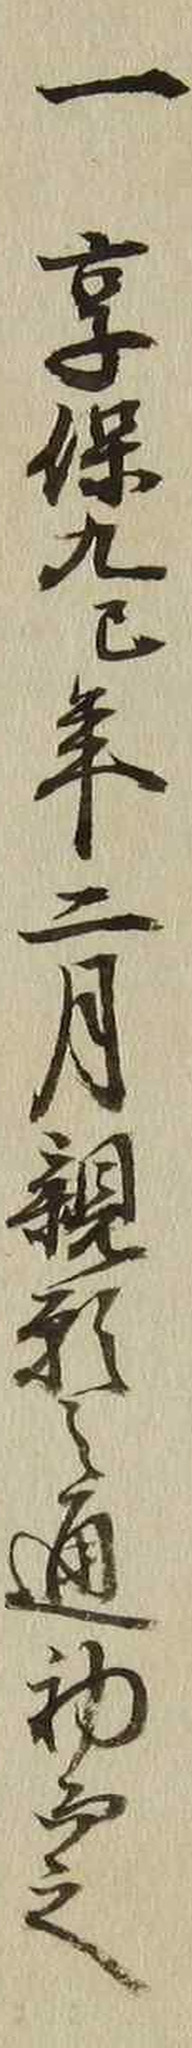一享保九巳年二月親願之通初而之
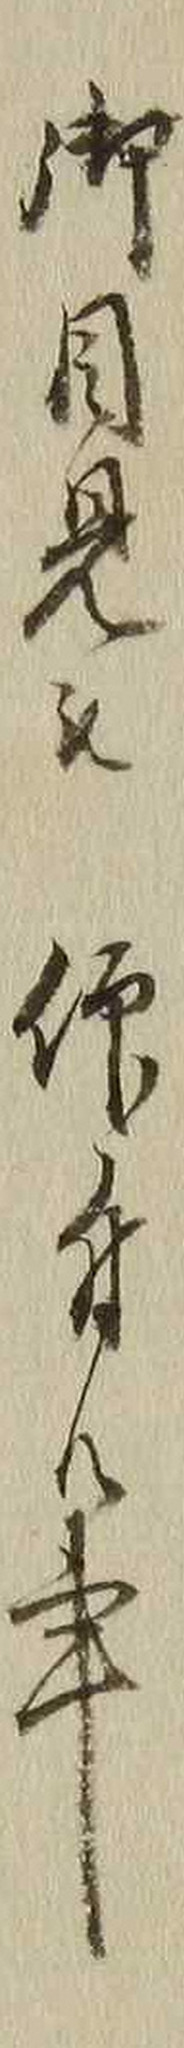御目見被仰付候事
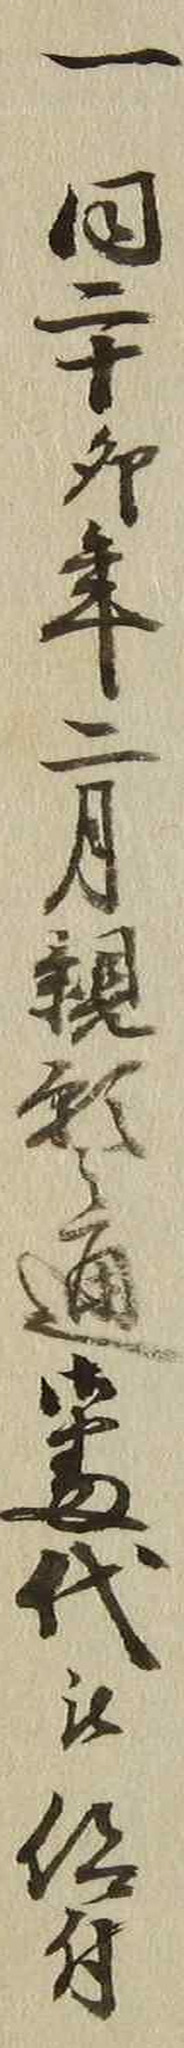一同二十卯年二月親願之通御番代被仰付
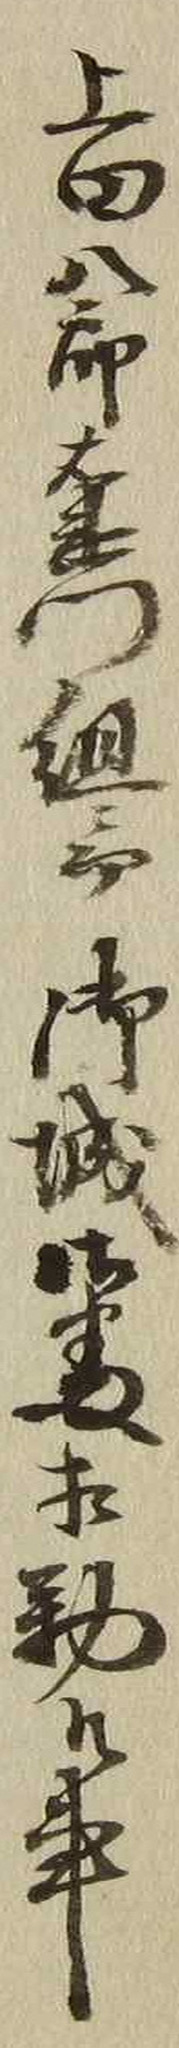上田八郎右衛門組ニ而御城御番相勤候事
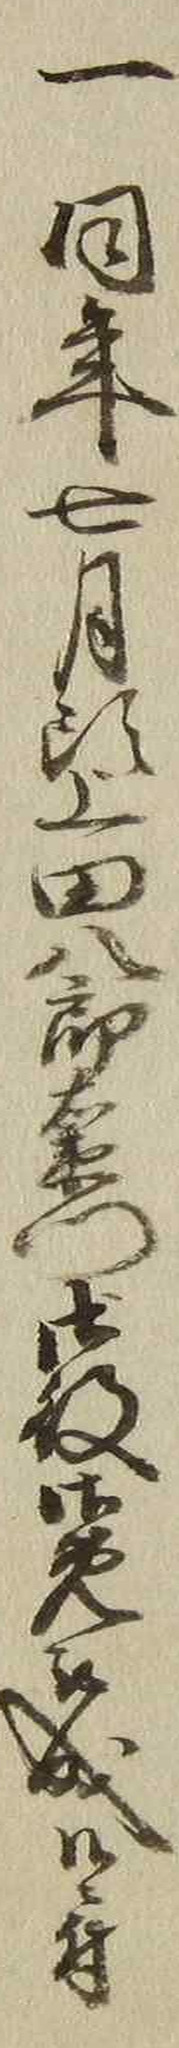一同年七月頭上田八郎右衛門御役御免被成候ニ付
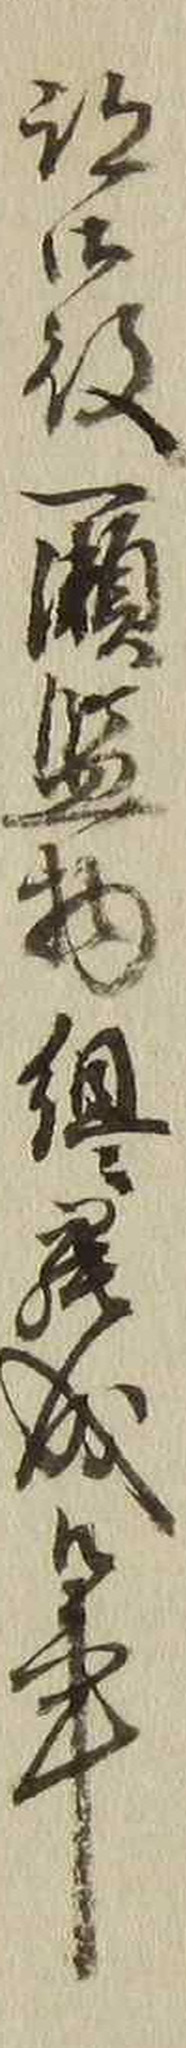跡御役一瀬監物組ニ罷成候事
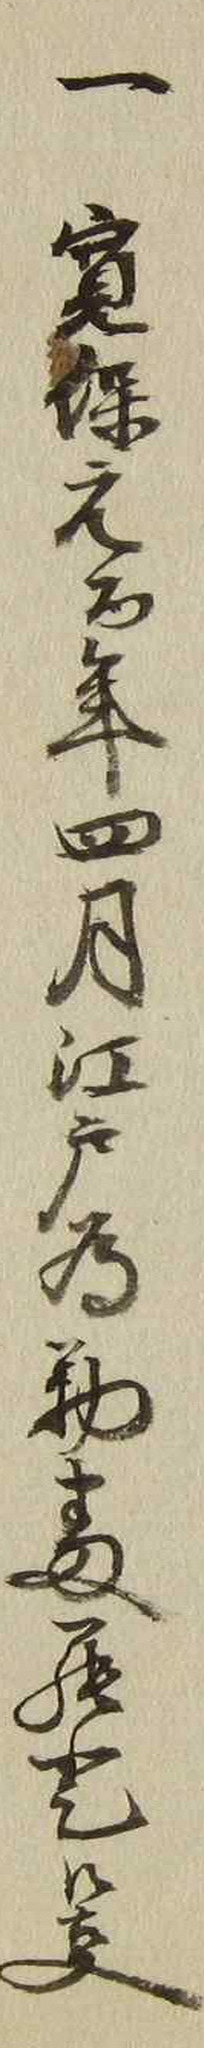一寛保元酉年四月江戸為勤番罷登候事
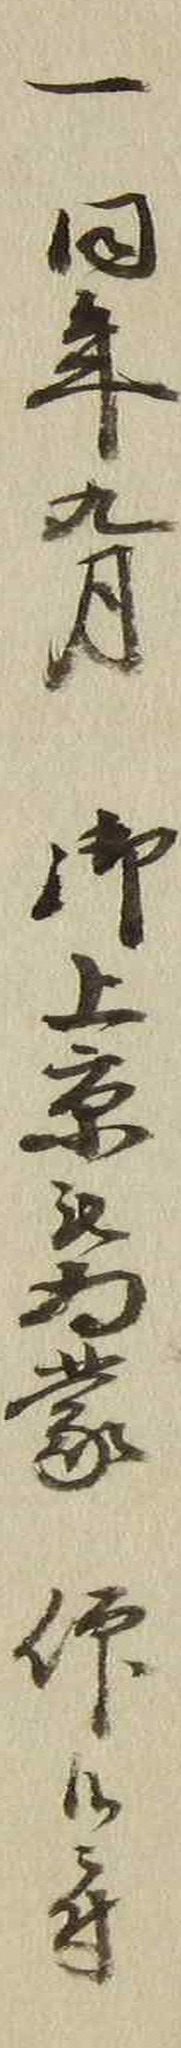一同年九月御上京被被為蒙仰候ニ付
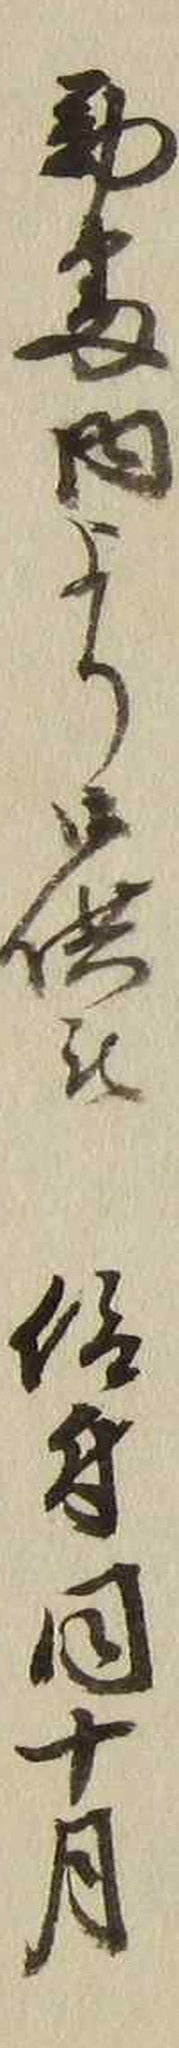勤番内より御供被仰付同十月
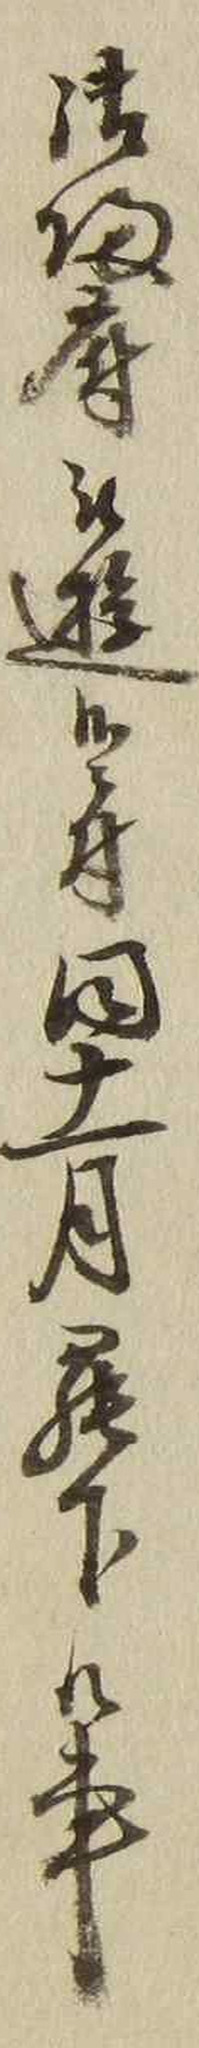御帰府被遊候ニ付同十一月罷下候事

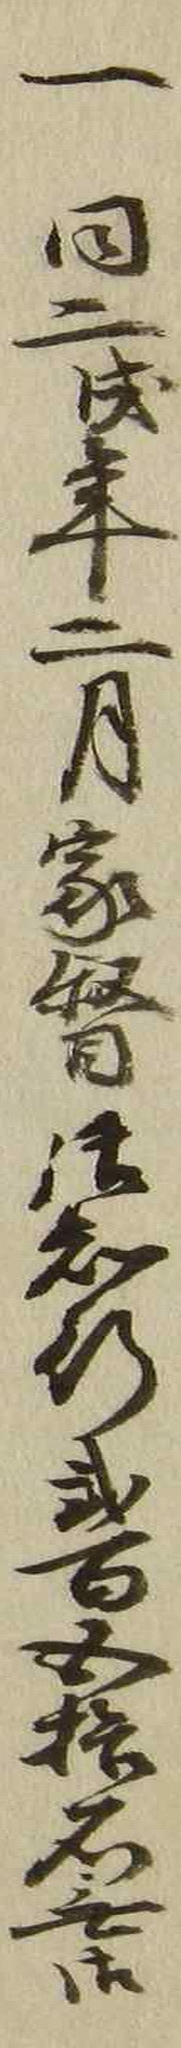一同二戌年二月家督御知行弐百五拾石無御
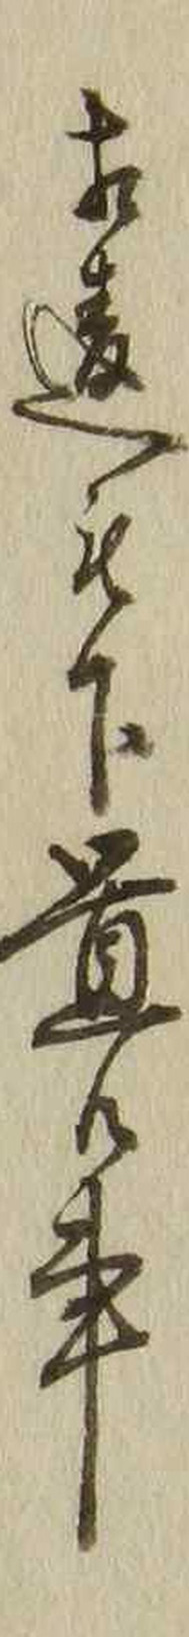相違被下置候事
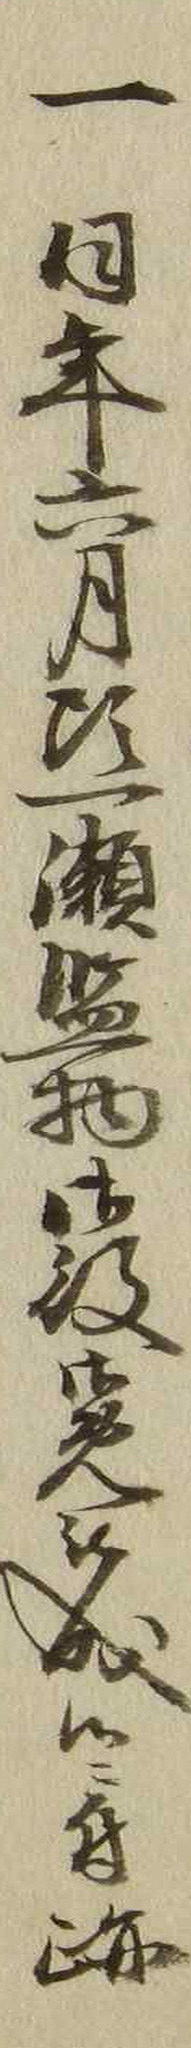一同年六月頭一瀬監物御役御免被成候ニ付跡
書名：諸士系譜　巻之64　と之部7
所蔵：会津若松市立会津図書館
